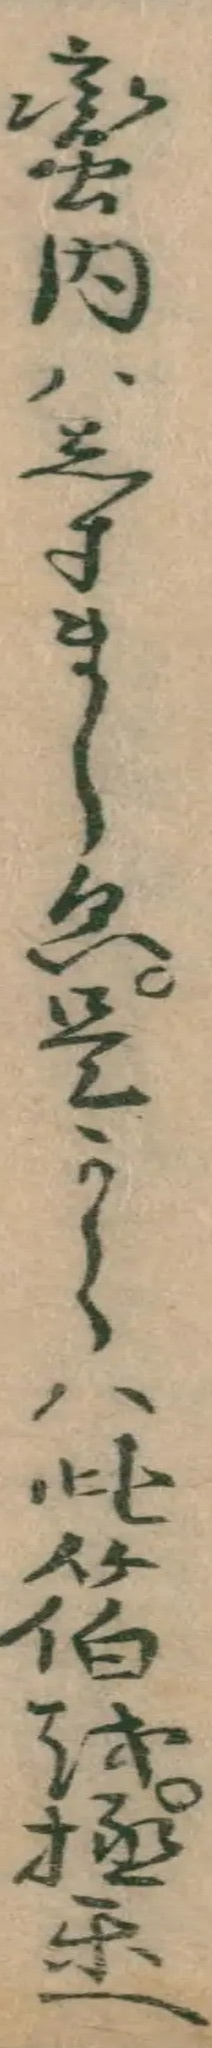蛮内はしすまし皃。是からは此箔を。極楽へ
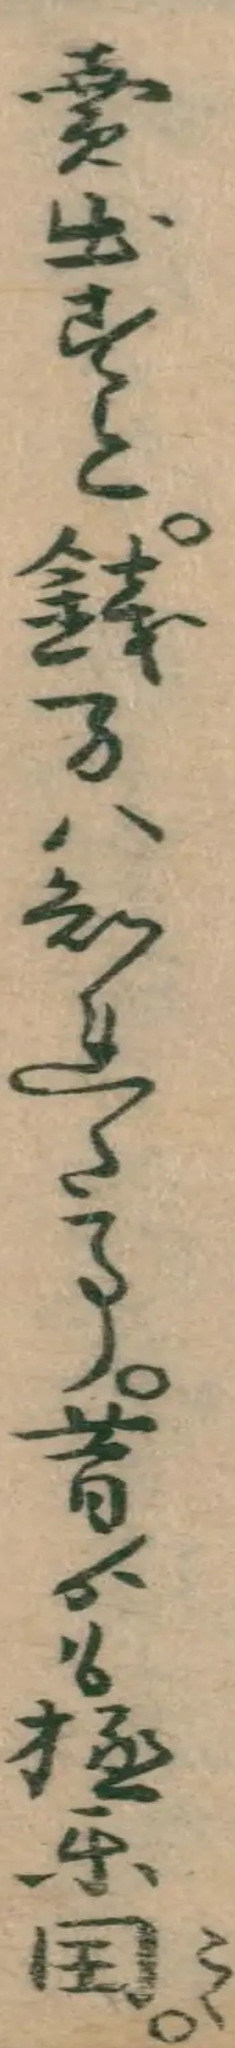売出すと。。銭万は知れた事。昔よりも極楽国。
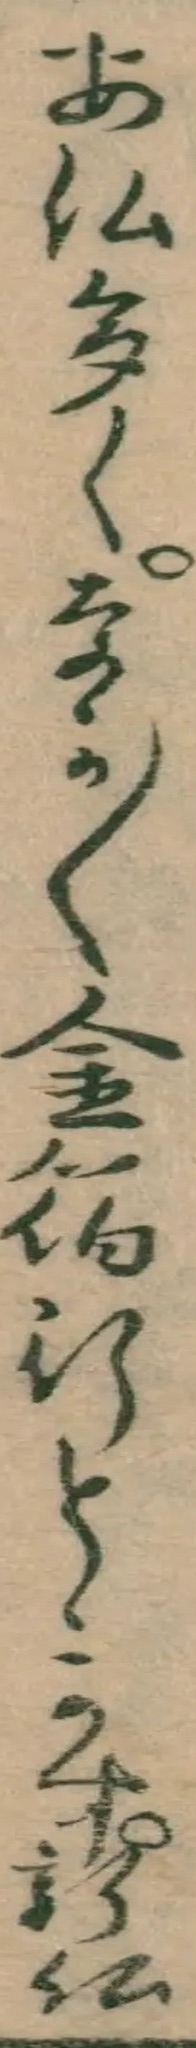安仏多く。なか〳〵金箔竹とゝかす。新仏
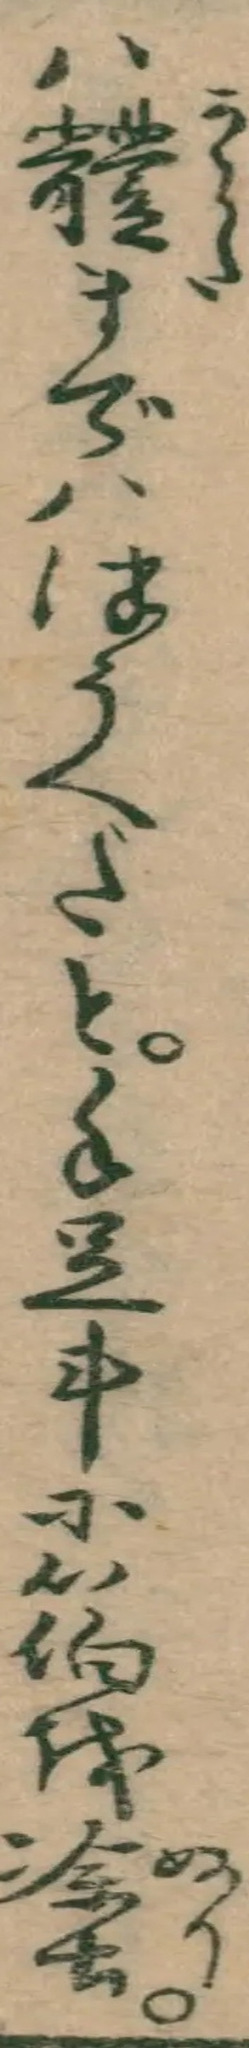は体まではつうくたと。手足斗に箔を塗。
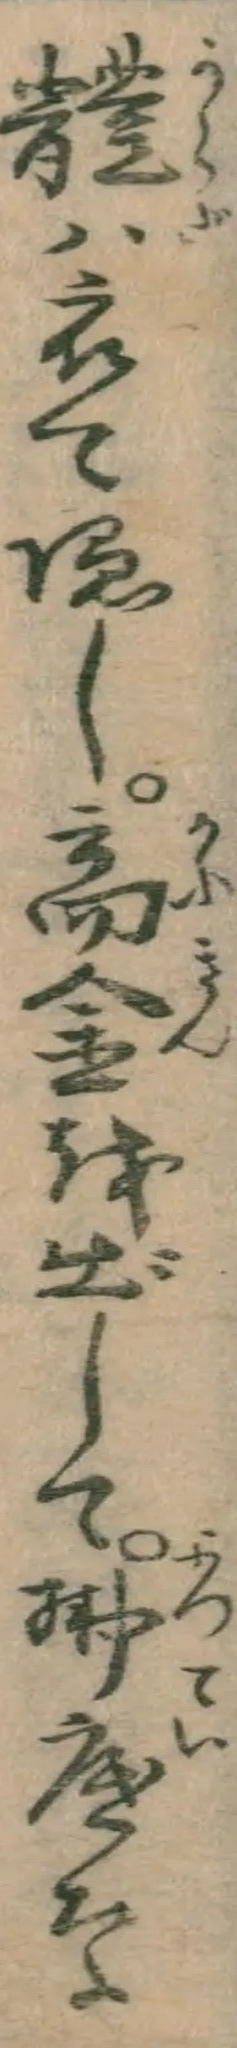体は衣て隠し。高金を”出して。払底な
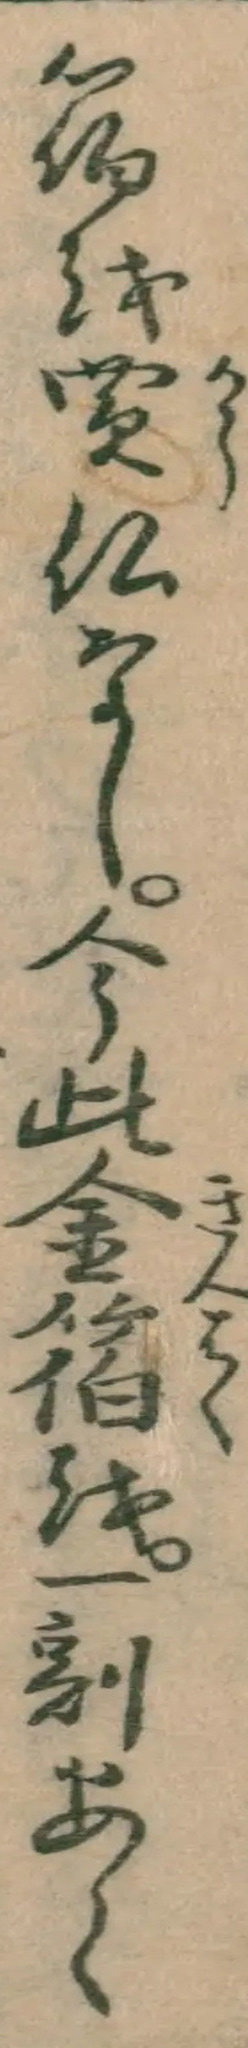箔を買仏なし。今此金箔を。一割安く
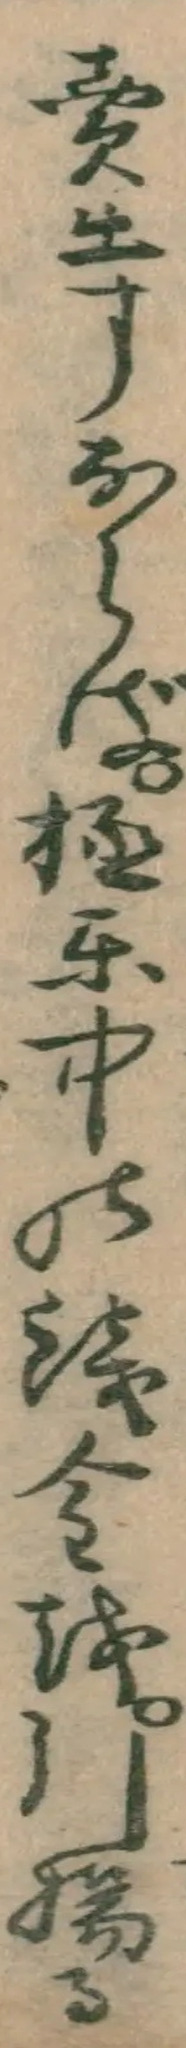売出すならば。極楽中の銭金を。引揚る
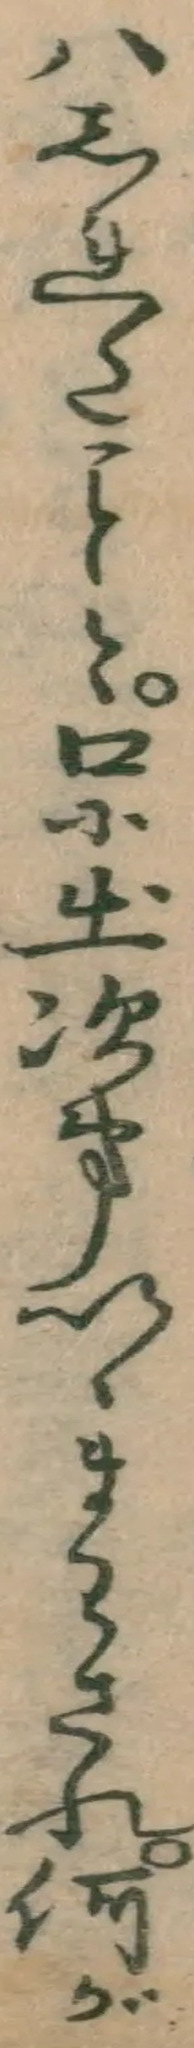はしれたことと。口に出次第いゝまわされ。何が
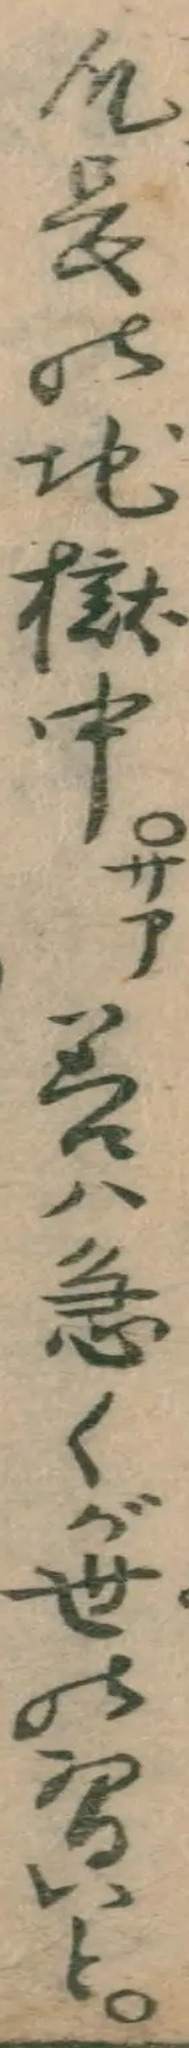爪長の地獄中。サア善は急くが世の習いと。
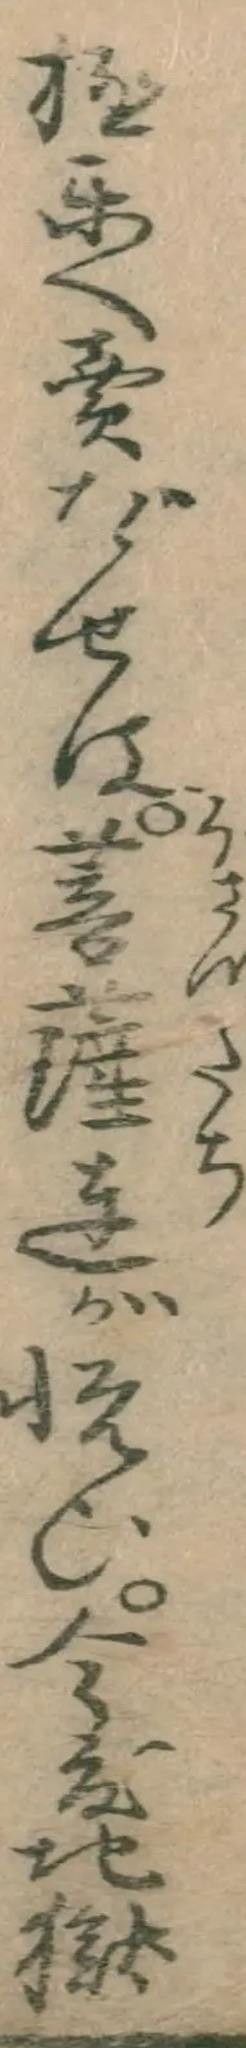極楽へ売だせは。菩薩達が悦ひ。今度地獄
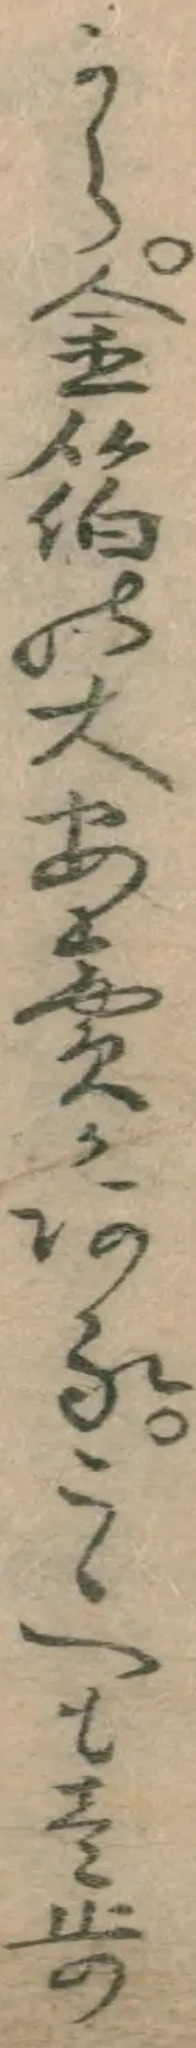から。金箔の大安売かある。こゝへも壱歩
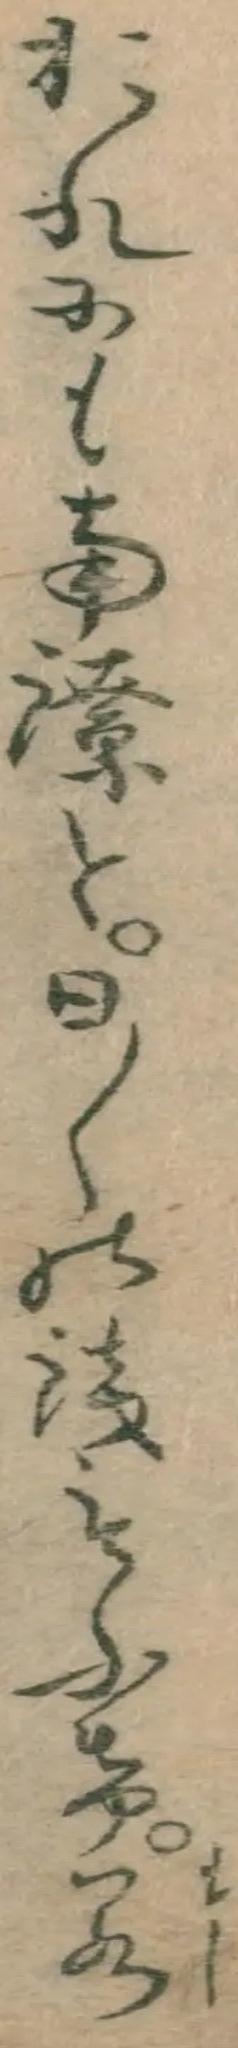おれにも南鐐と。日〳〵の銭もふけ。若

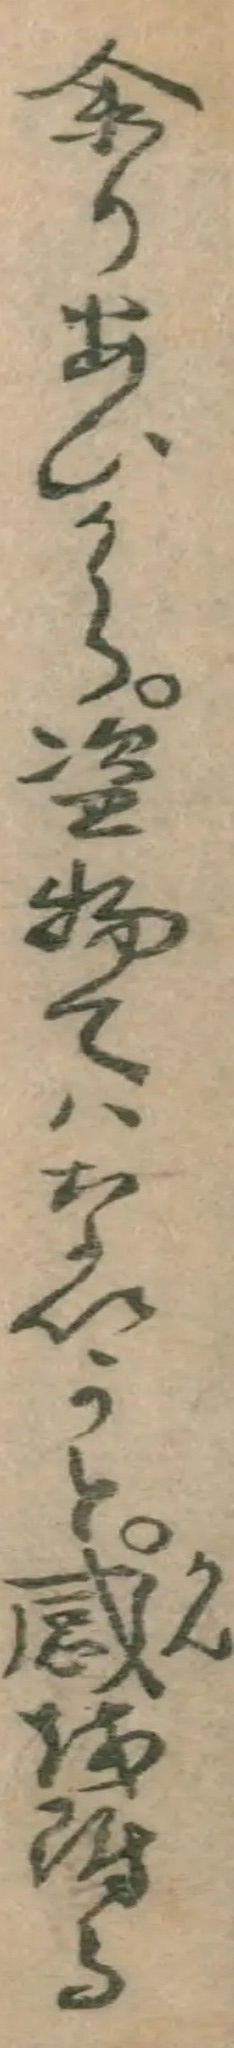余り安いから。盗物てはないかと。感を付る
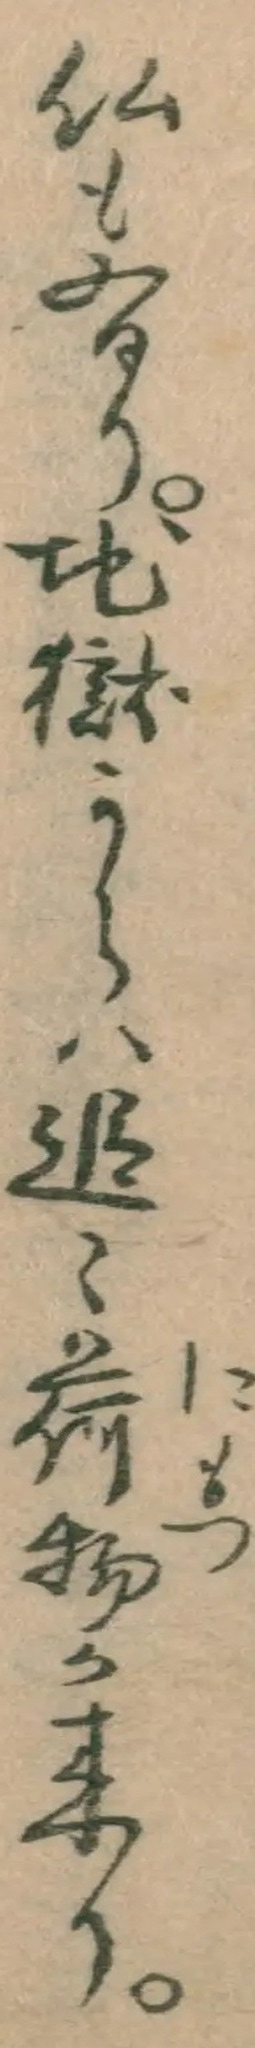仏も有り。地獄からは追々荷物か来り。
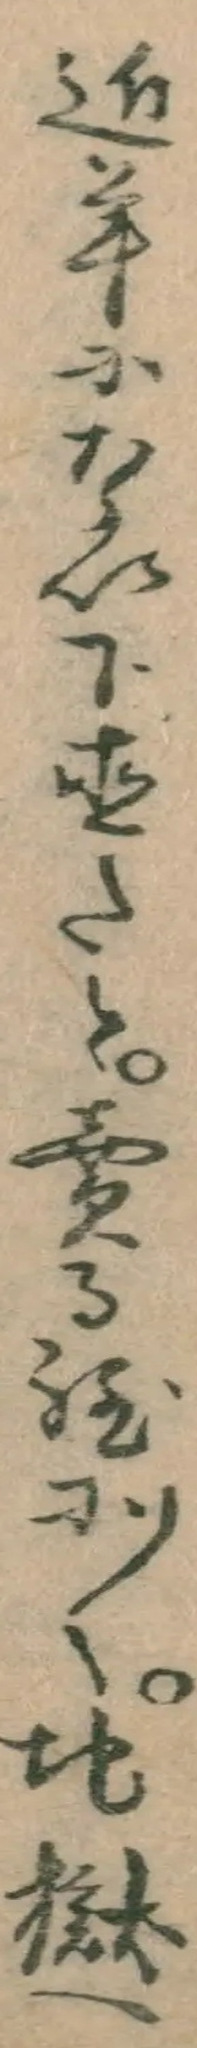近年にない下直たと。売る程に〳〵。地獄へ
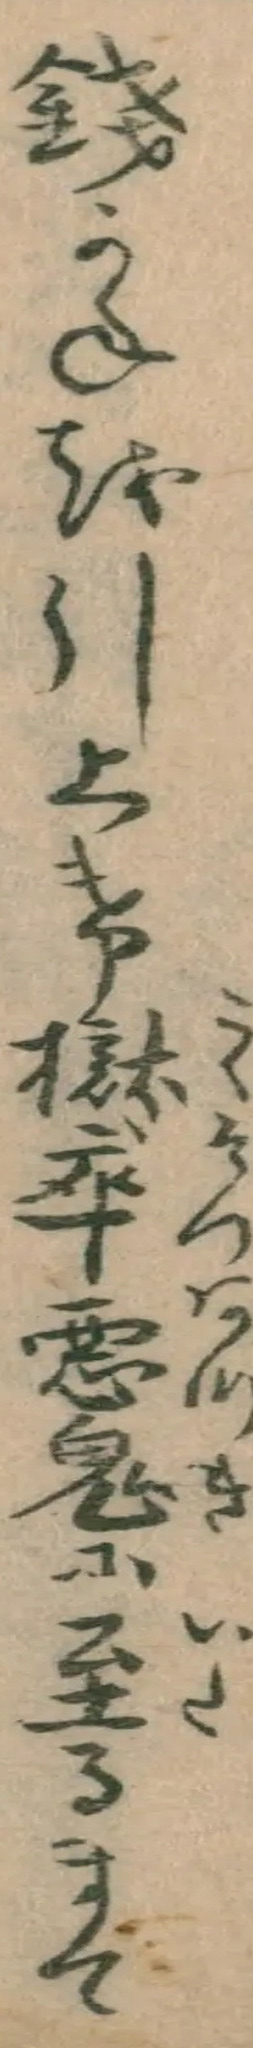銭かねを引上け獄卒悪鬼に至るまで
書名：翻草盲目
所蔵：国立国会図書館 National Diet Library, JAPAN
